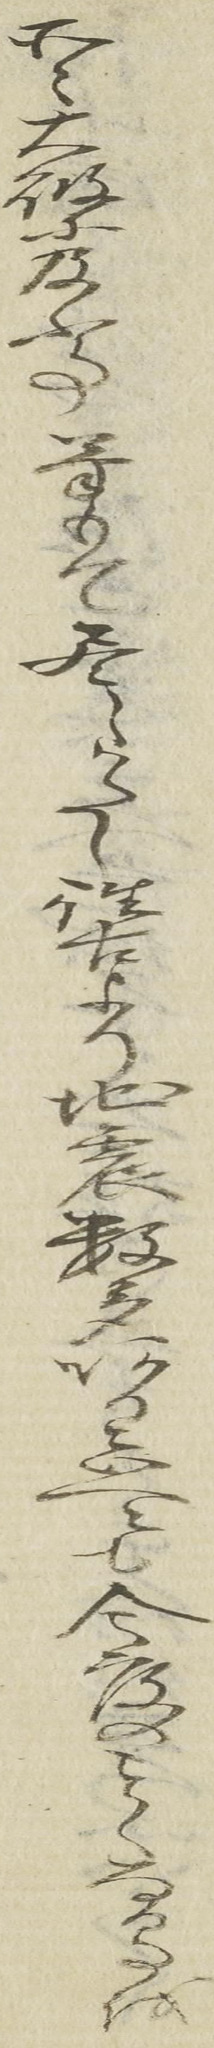所〻大破に及ふ事筆もて尽しかたし往古より地震数多ありといへとも今度のことくなる事を
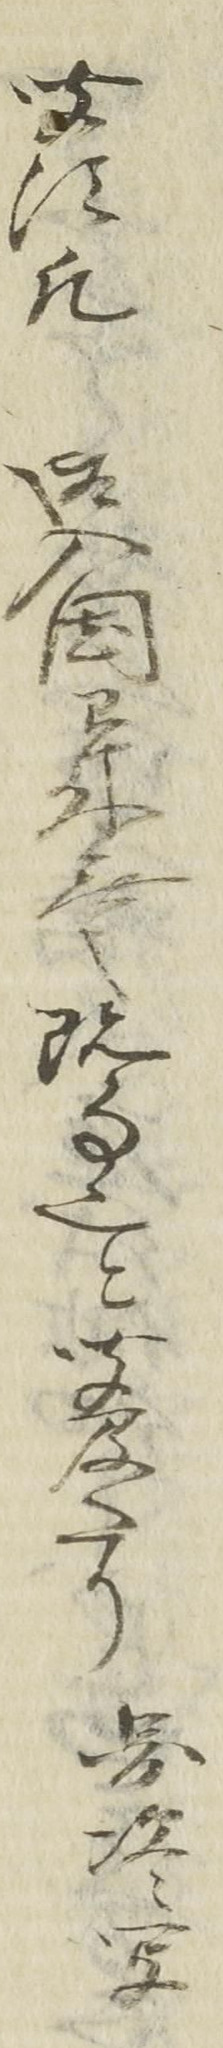聞す凡御入国已来無之既事也と聞及たり図次ニ写
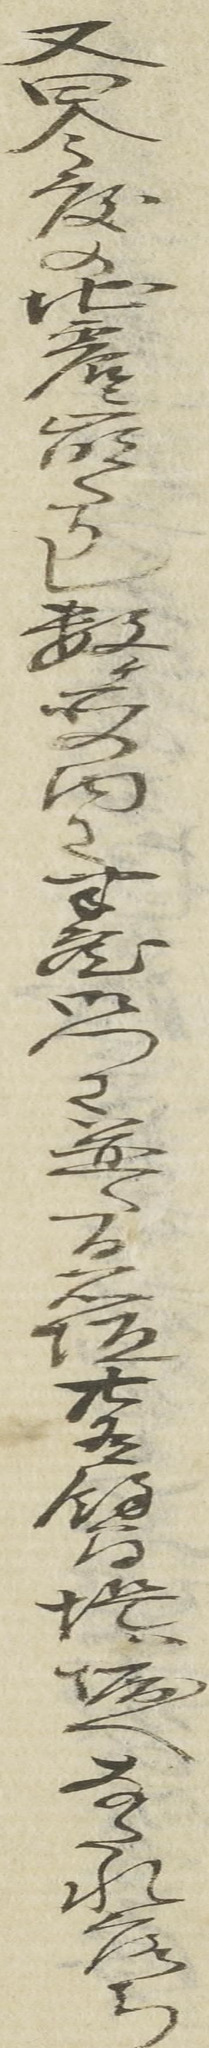又曰今度の地震崩たりし数ケ所の内に半蔵御門に並たる石垣廿有余間堤ハ堀へなたれ落ち
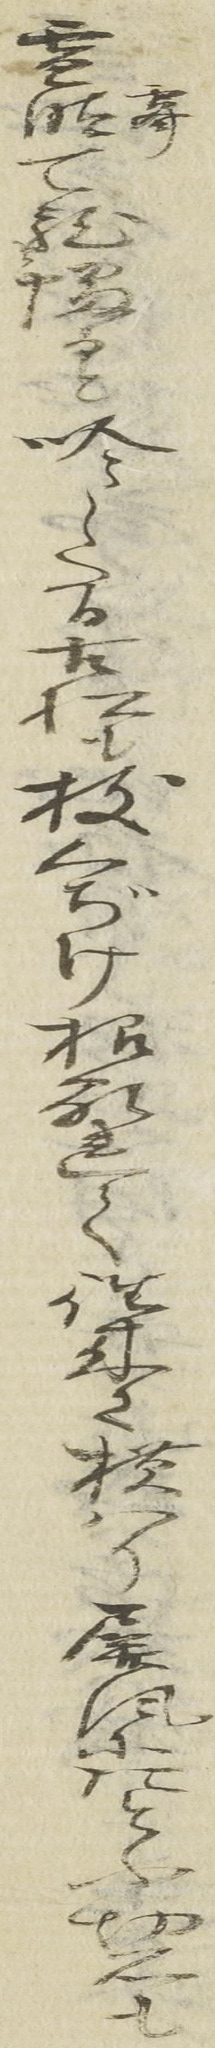電？天龍幡ると呤したる古松も枝くぢけ根顕れて往来に横ハり屏風にたとふ切石も
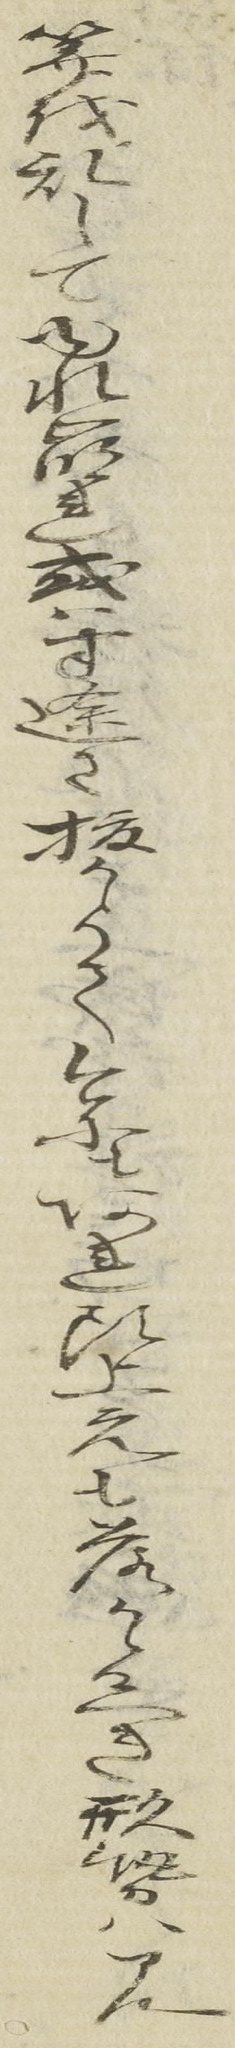算を乱してゆれ崩れ或ハ半途に抜からて今にもあれ頭上えも落かゝるへき形勢ハ見
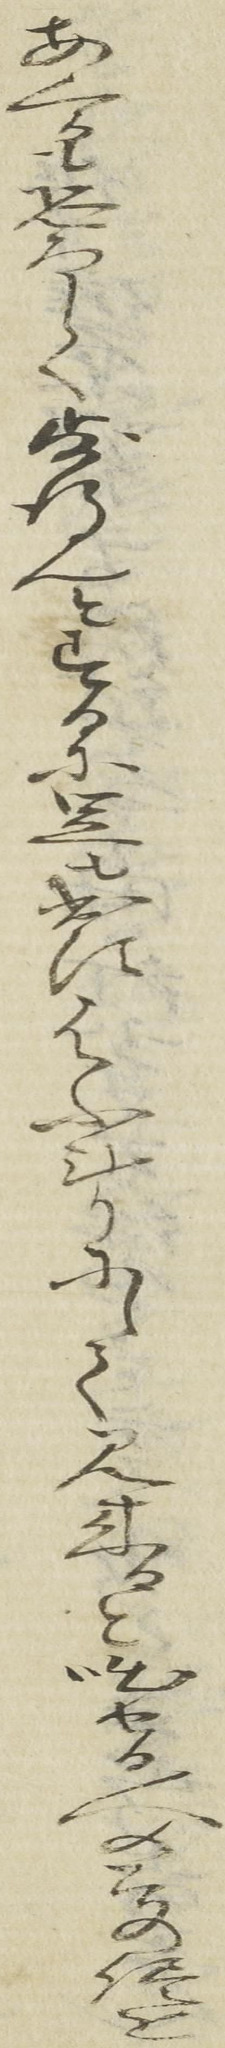あくるも恐ろしく歩行かんとするに足も出すはふ斗りにして見来ると咄セる人のその侭を
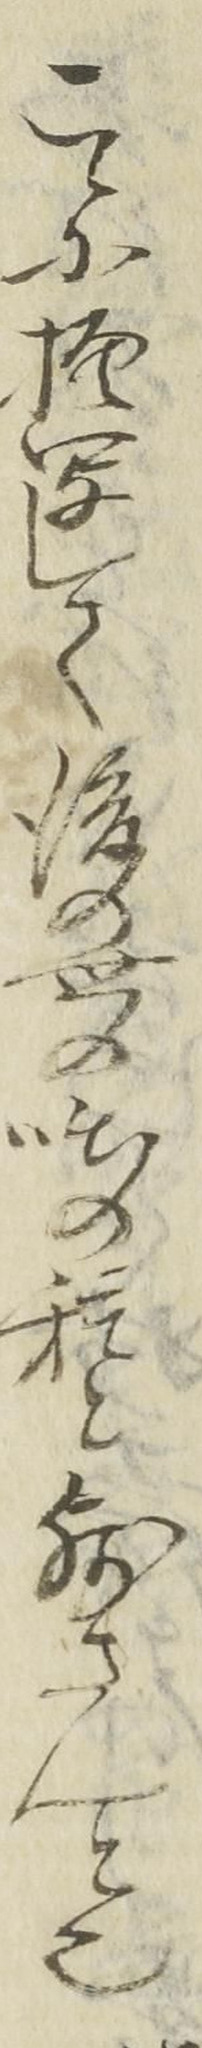こゝに模写して後の世の咄の種と残さんと也此図略

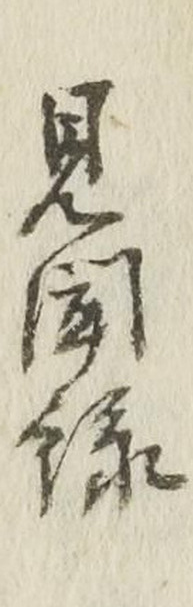見聞録
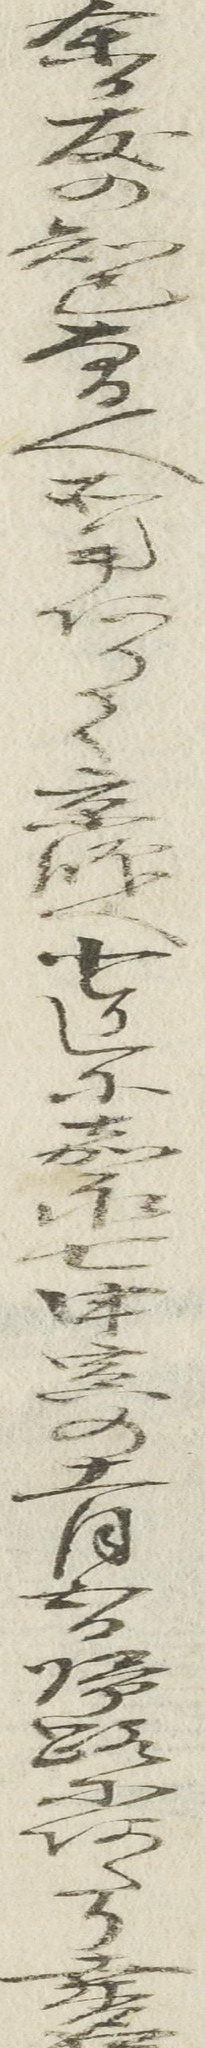一余か友の知己なる人所用ありて京師へ登りしに嘉永七甲寅之十一月五日帰路にあたり桑名
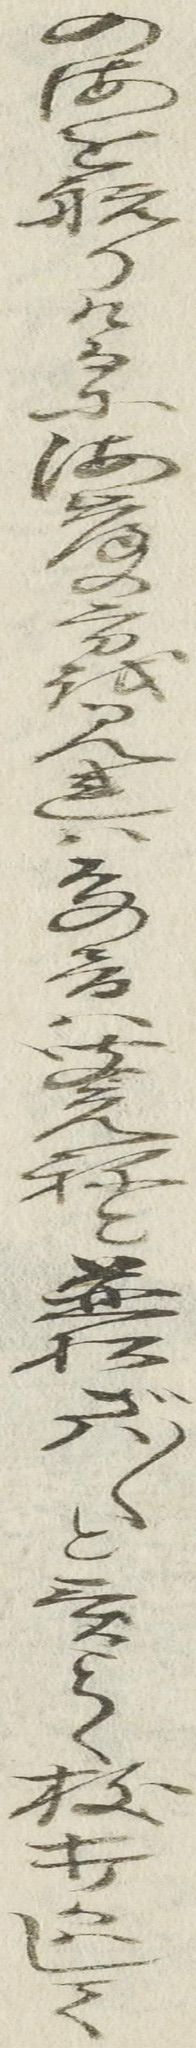の海を航りケるに海岸の方を見れハその音ハ聞えねと並松ざハ〳〵と云かことく枝打かハして
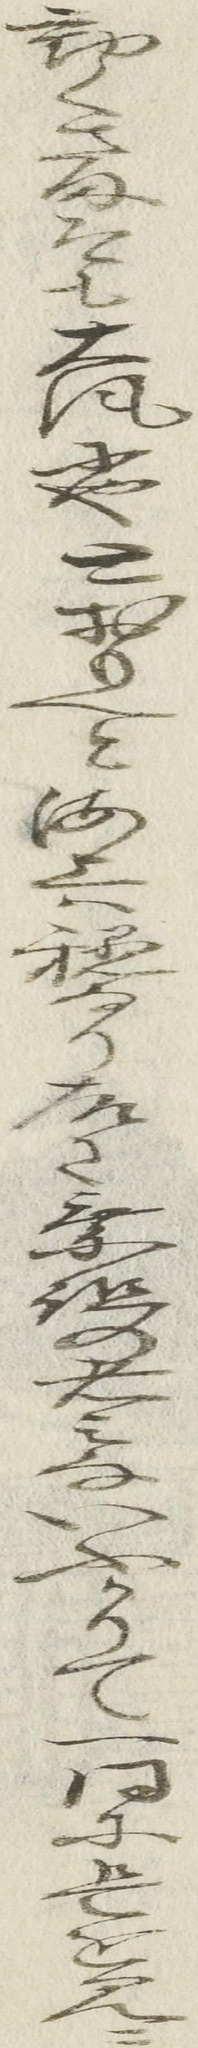動くさま今も大風にやとおもへと海上ハ穏なり故に乗組の者ミないふかりて一同に是を見ニ
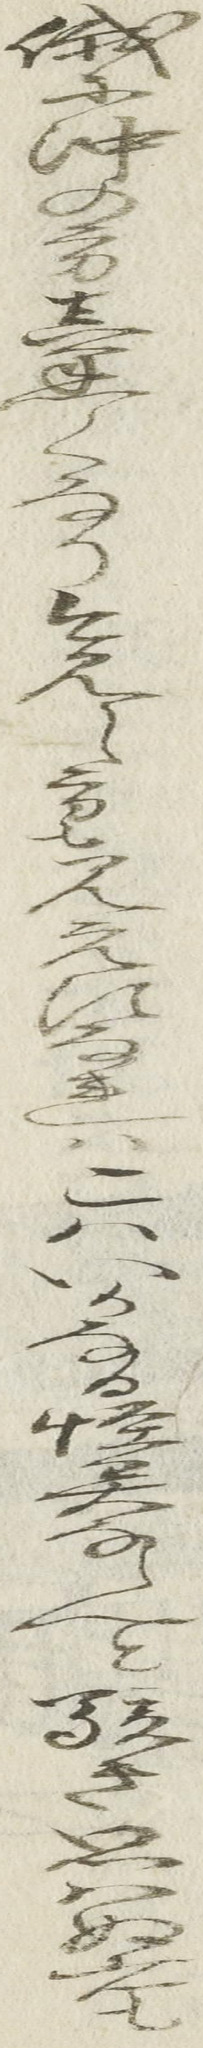俄に沖の方真黒くなり今見し方も見えすなれハこハいかなる怪異ならんと駭き思ハぬ者も
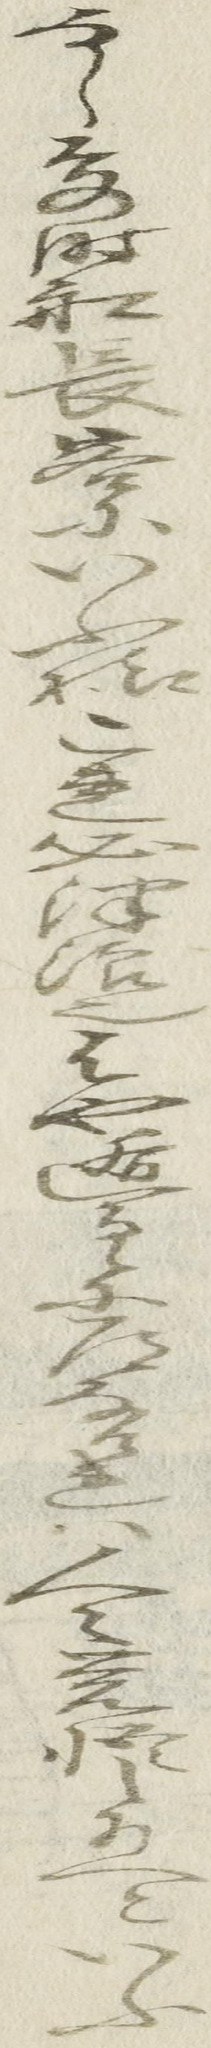なしその時船長客にいふ様これ必津浪也はや遁るゝに道なケれハ人〻覚悟し給へといふ
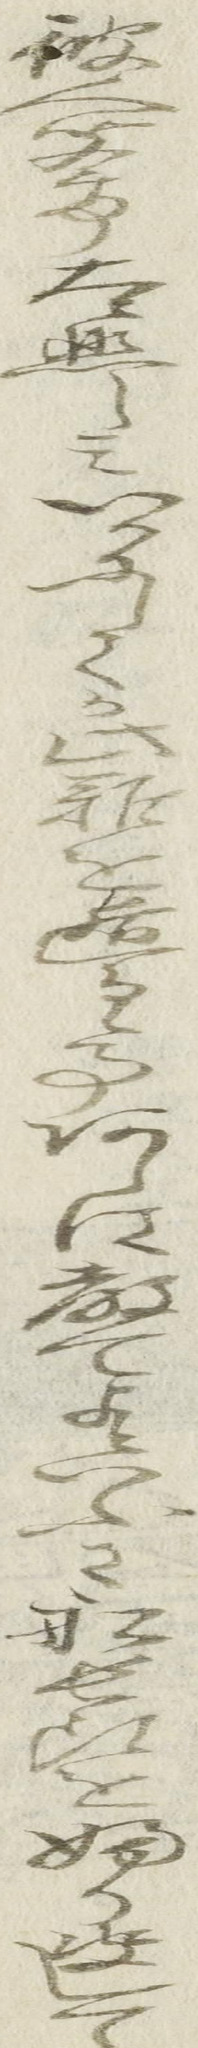彼人聞方大ニ悲しミいかにしてか此難を遁るゝ事あらは教てよといふに船長頭をふり決して
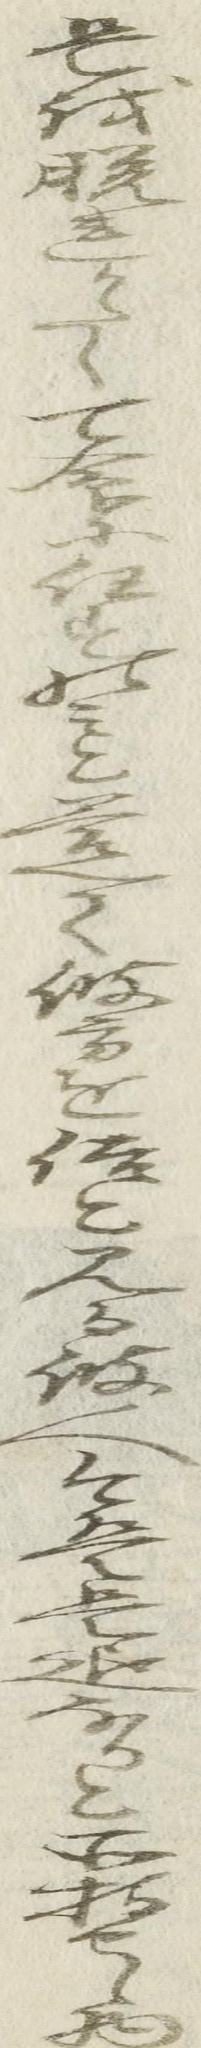是を脱れかたし天命に任すのミと答へて彼方を佶と見る彼人今は是迄なりと所持セし物
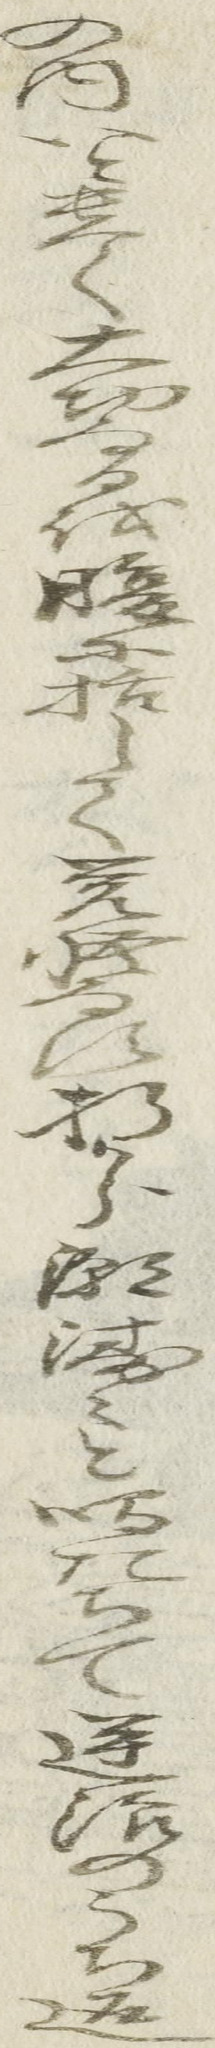の内いと貴く大切なるを腹に括して覚悟なす折から潮濤〻と鳴たちて逆流のうち返
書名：安政乙卯江戸大地震筆記　安政丙辰八月大阪大雷雨之記追加　安政三辰年七月松前辺大地震并八月大風雨記録
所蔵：東京大学地震研究所図書室 Earthquake Research Institute Library, The University of Tokyo, JAPAN
